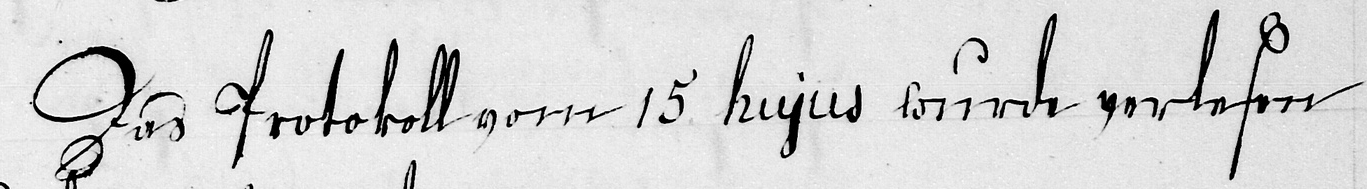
Das Protokoll vom 15. hujus wurde verlesen
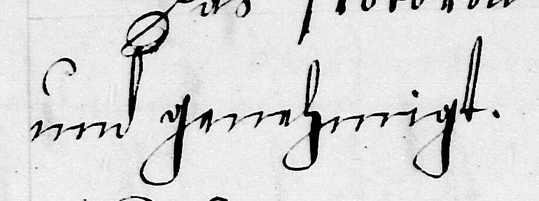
und genehmigt.
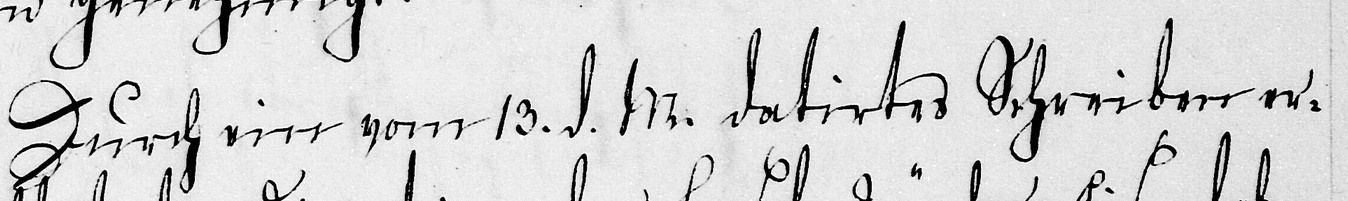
Durch ein vom 13. d. M. datirtes Schreiben ers¬
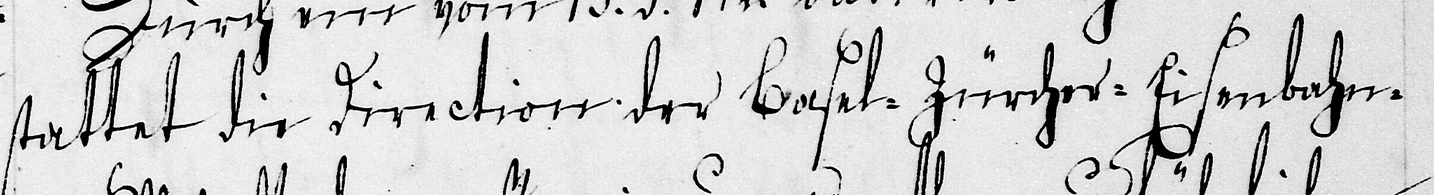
tattet die Direction der Basel-Zürcher-Eisenbahn¬
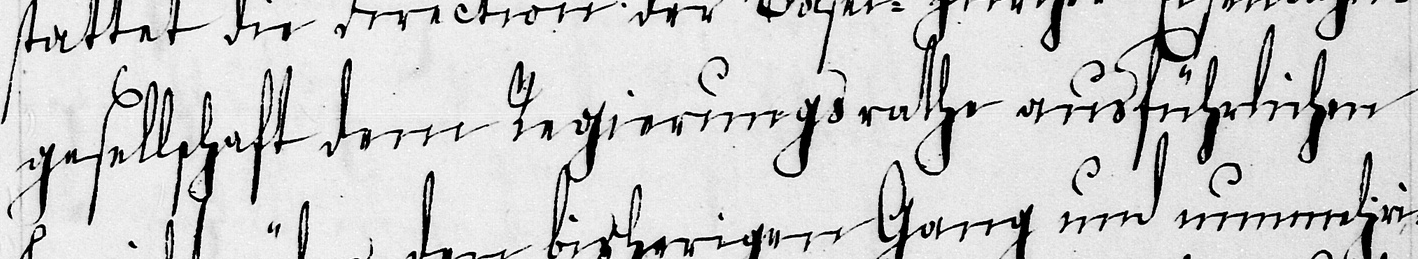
gesellschaft dem Regierungsrathe ausführlichen
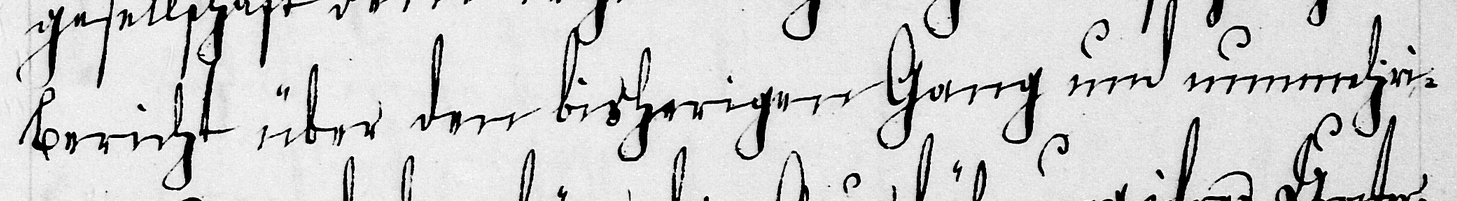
Bericht über den bisherigen Gang und nunmehri¬
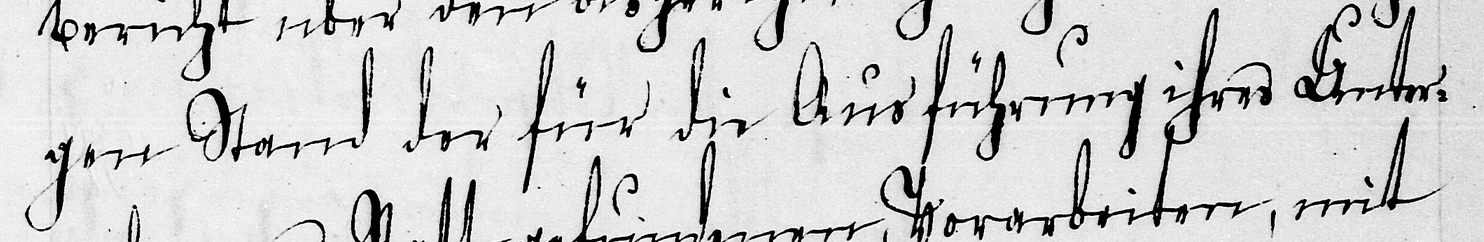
gen Stand der für die Ausführung ihres Unter¬
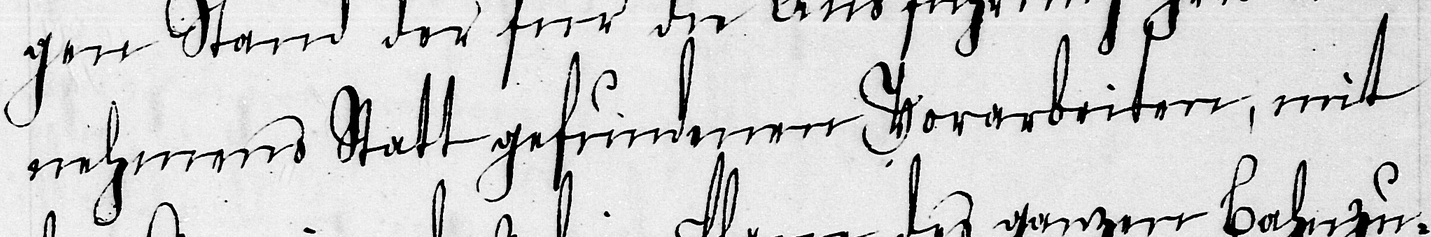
nehmens Statt gefundenen Vorarbeiten, mit
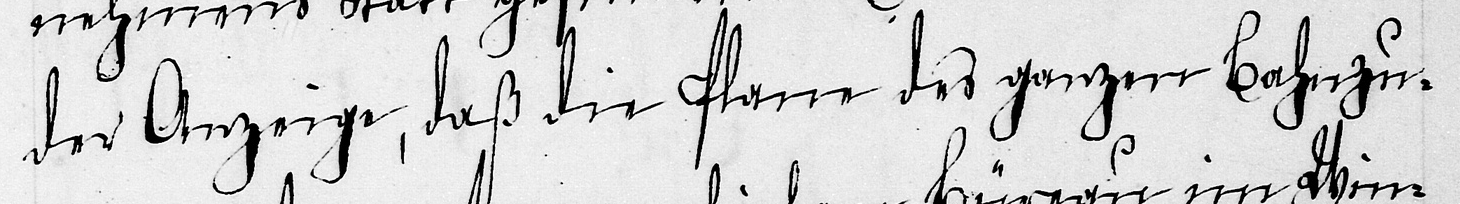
der Anzeige, daß die Plane des ganzen Bahnzu¬
